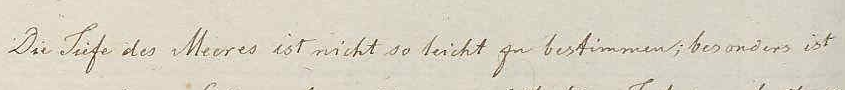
Die Tiefe des Meeres ist nicht so leicht zu bestimmen; besonders ist
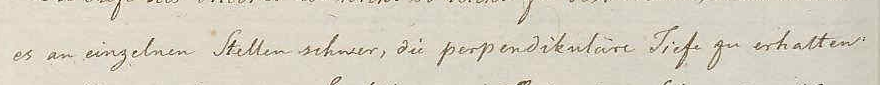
es an einzelnen Stellen schwer, die perpendikuläre Tiefe zu erhalten:
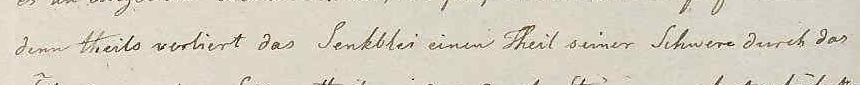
denn theils verliert das Senkblei einen Theil seiner Schwere durch das
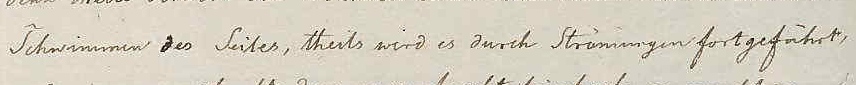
Schwimmen des Seiles, theils wird es durch Strömungen fortgeführt,
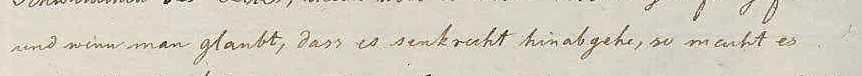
und wenn man glaubt, dass es senkrecht hinabgehe, so macht es
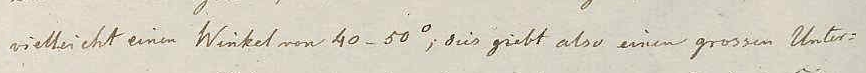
vielleicht einen Winkel von 40–50°; dies giebt also einen grossen Unter-
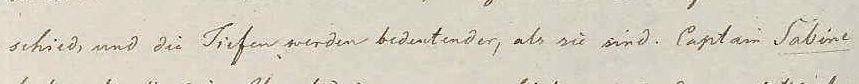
schied, und die Tiefen werden bedeutender, als sie sind. Captain Sabine
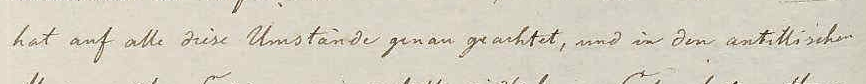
hat auf alle diese Umstände genau geachtet, und in den antillischen
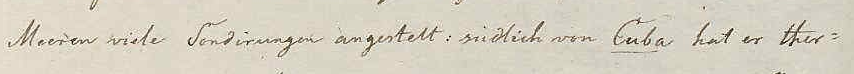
Meeren viele Sondirungen angestelt: südlich von Cuba hat er ther-
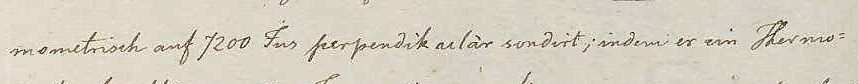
mometrisch auf 7200 Fus perpendikulär sondirt; indem er ein Thermo-
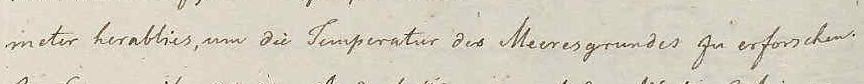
meter herablies, um die Temperatur des Meeresgrundes zu erforschen.
